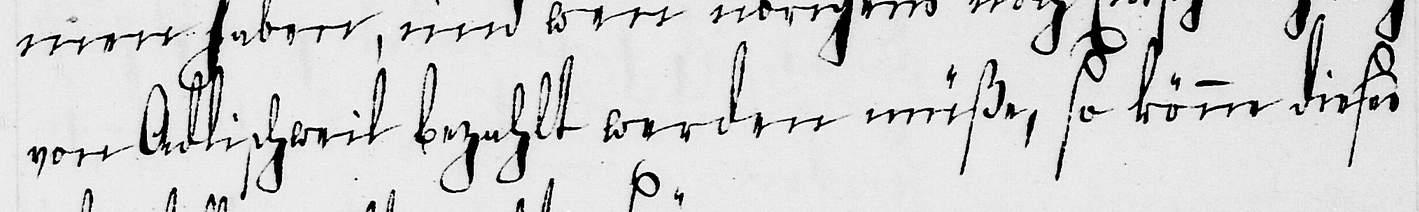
von Adlischweil bezahlt werden müße, so könne dieses
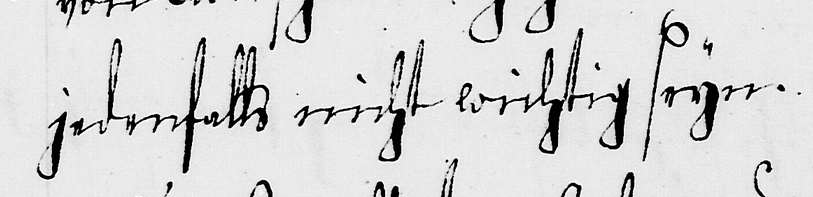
jedenfalls nicht wichtig seyn.
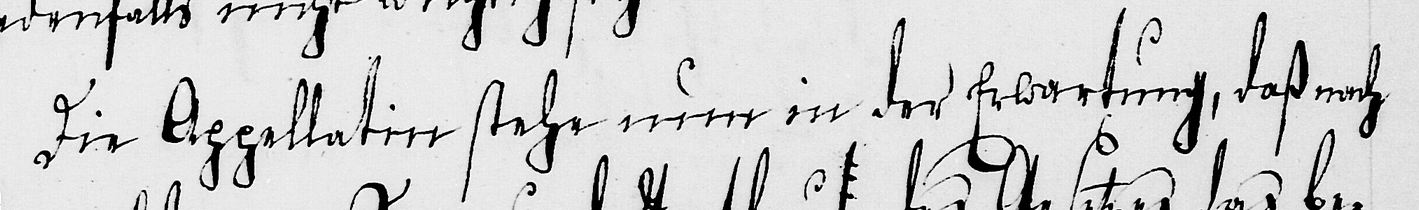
Die Appellatin stehe nun in der Erwartung, daß nach
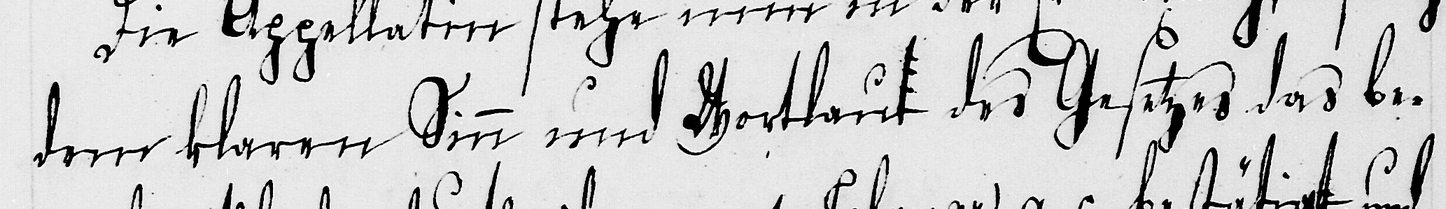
dem klaren Sinn und Wortlaut des Gesetzes das be¬
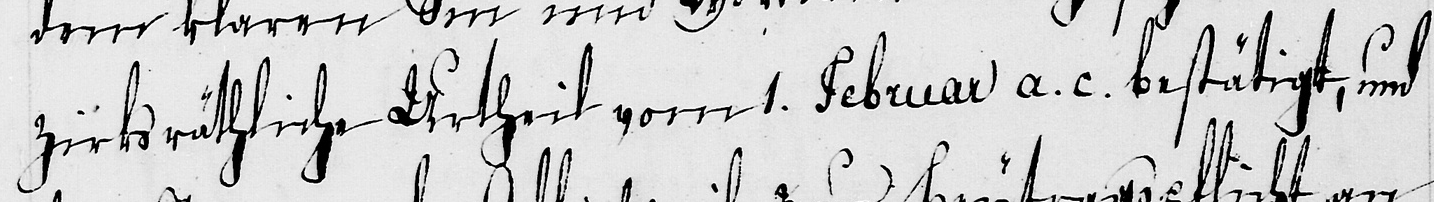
zirksräthliche Urtheil vom 1. Februar a. c. bestätigt, und
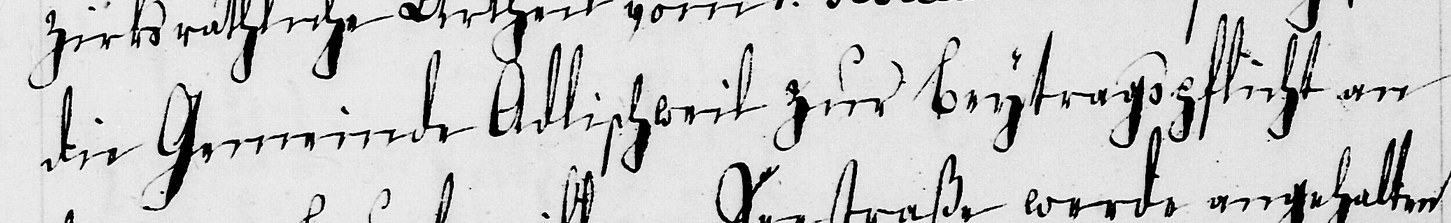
die Gemeinde Adlischweil zur Beytragspflicht an
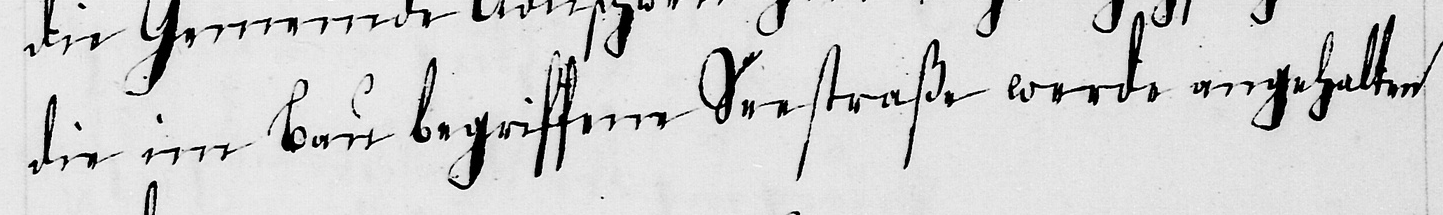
die im Bau begriffene Seestraße werde angehalten
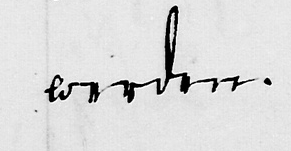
werden.
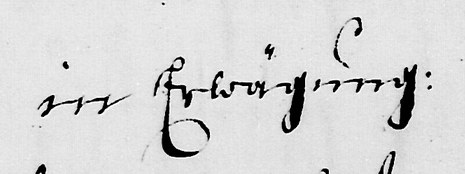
in Erwägung:
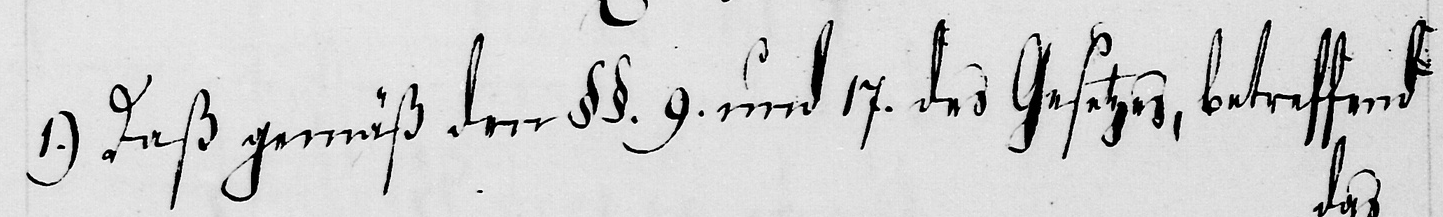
1.) Daß gemäß den §§. 9. und 17. des Gesetzes, betre¬
